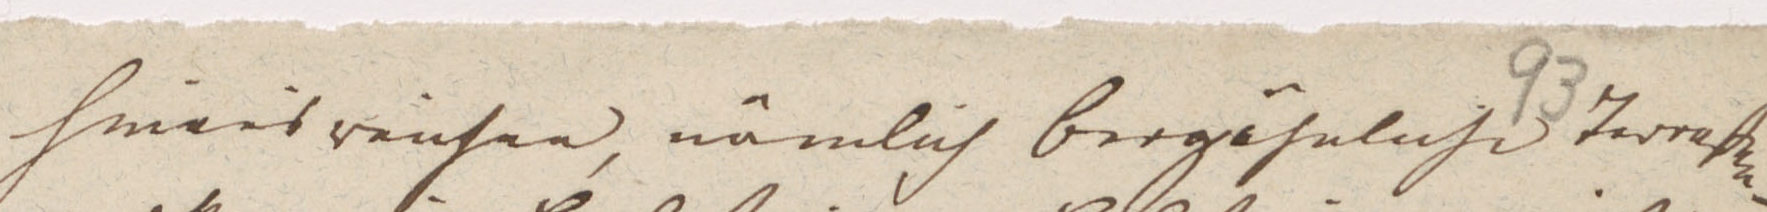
hinaus reichen, nämlich bergänhnliche Terrassen-
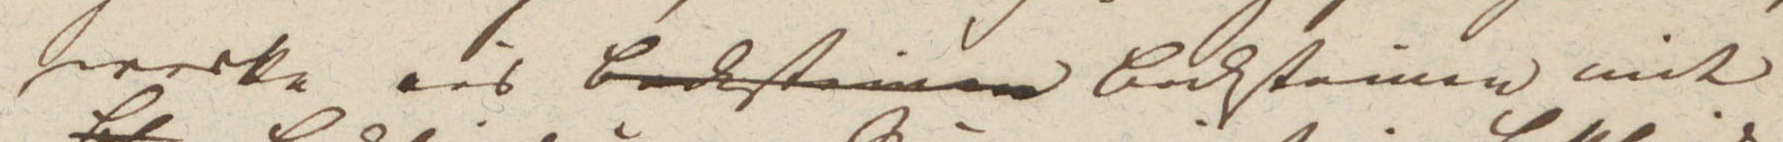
werke aus Backsteinen Backsteinen mit
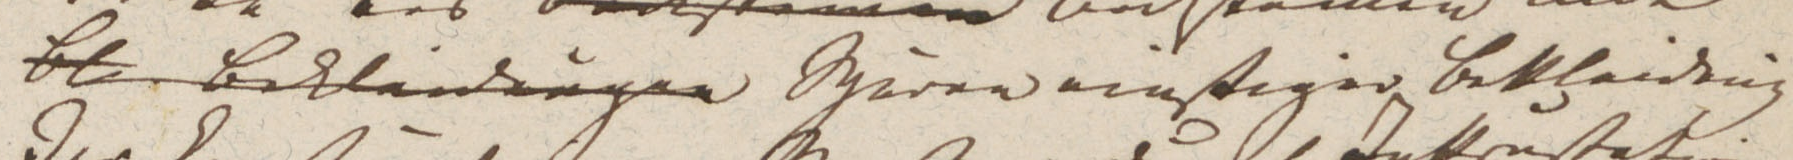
Bl Bekleidungen Spuren einstiger Bekleidung
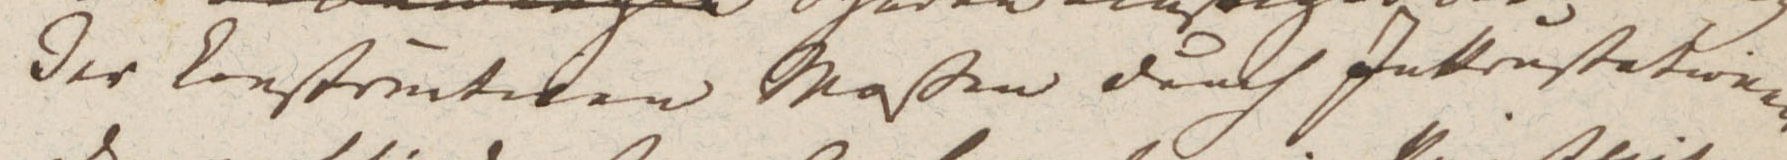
der konstructiven Massen durch Inkrustationen
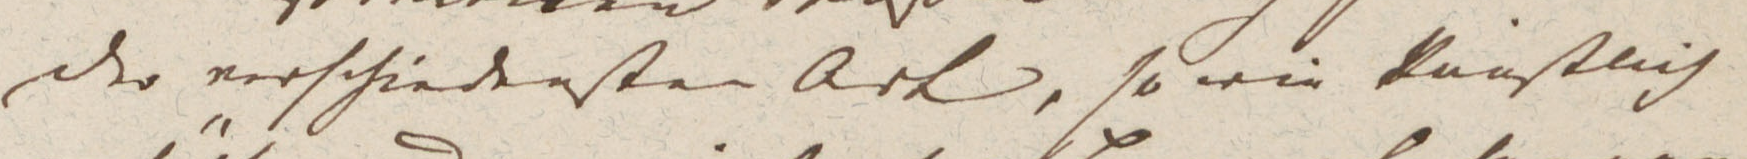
der verschiedensten Art, so wie künstlich
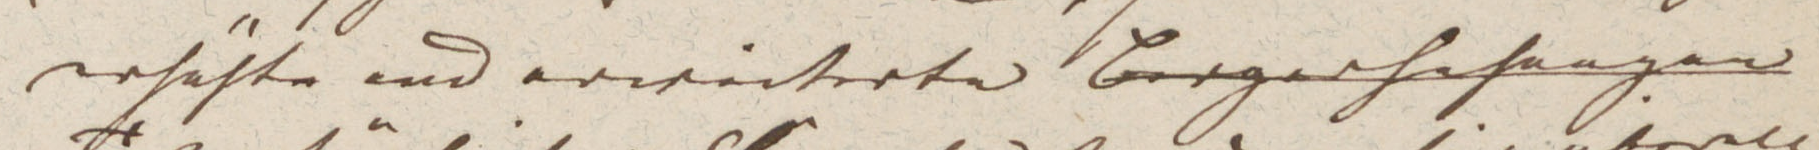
erhöhte und erweiterte Bergerhohungen
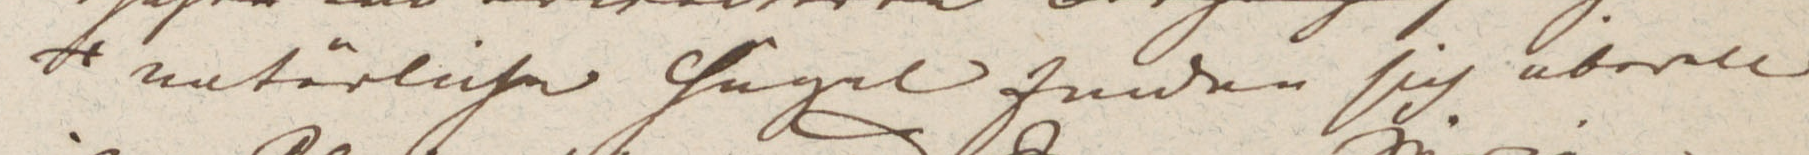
natürliche Hügel fanden sich überall
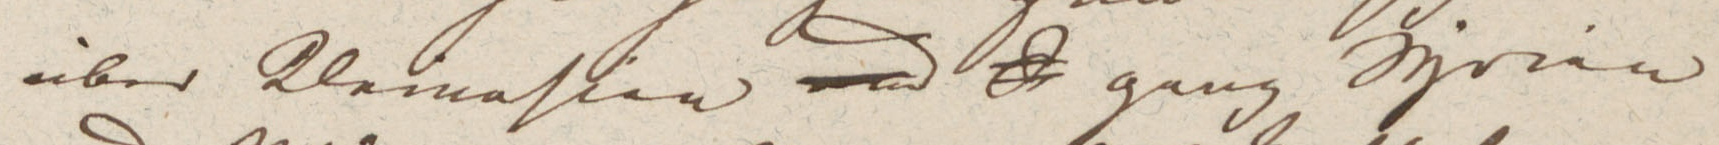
über Kleinasien und S ganz Syrien
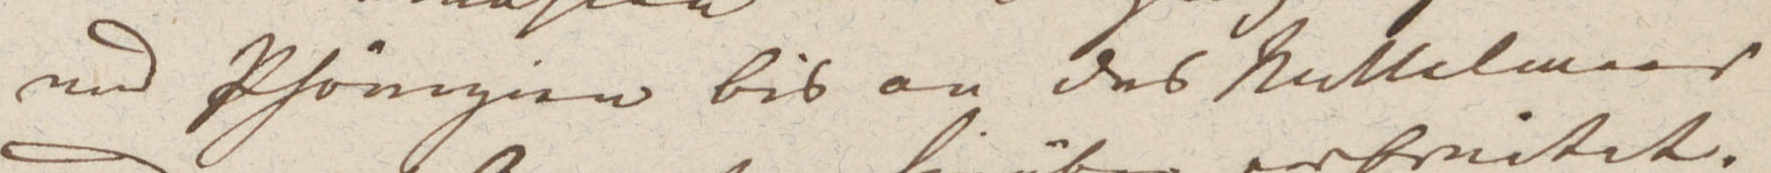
und Phönizien bis an das Mittelmeer
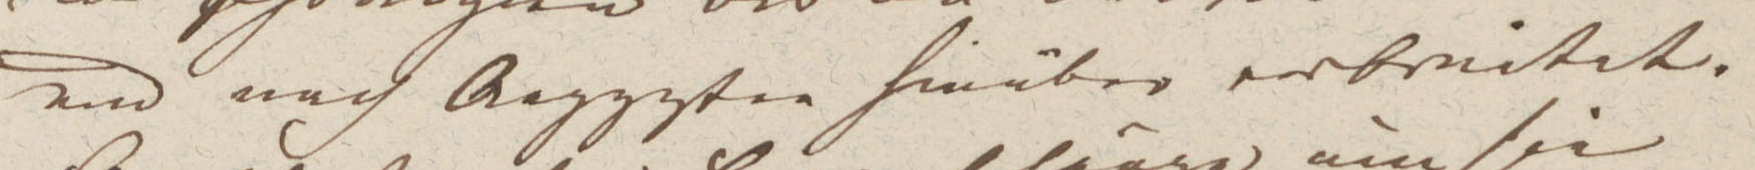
und nach Aegypten hinüber verbreitet.
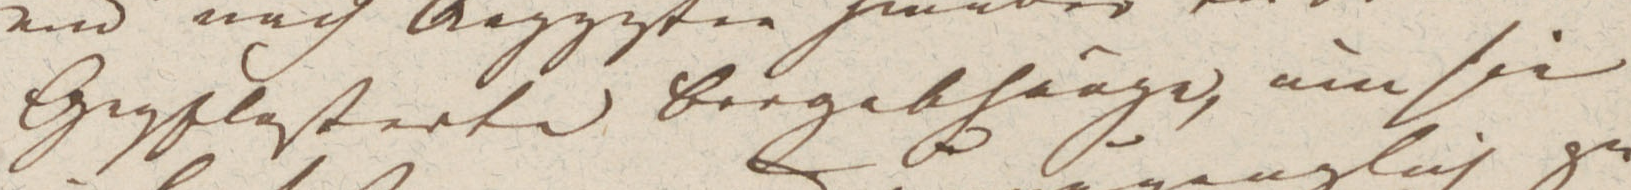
Gepflasterte Bergabhänge, um sie
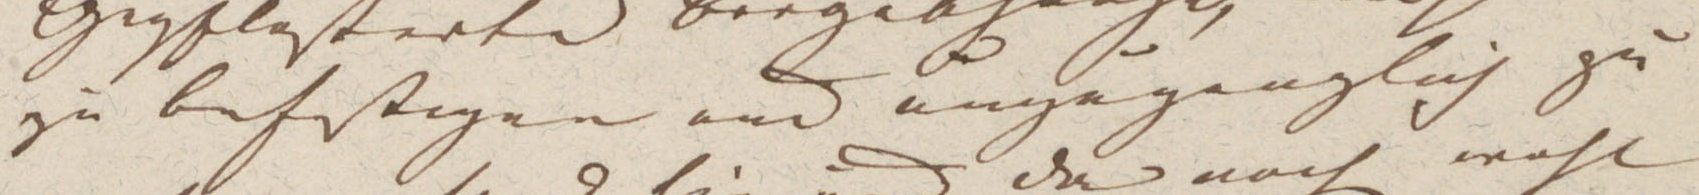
zu befestigen und unzuganglich zu
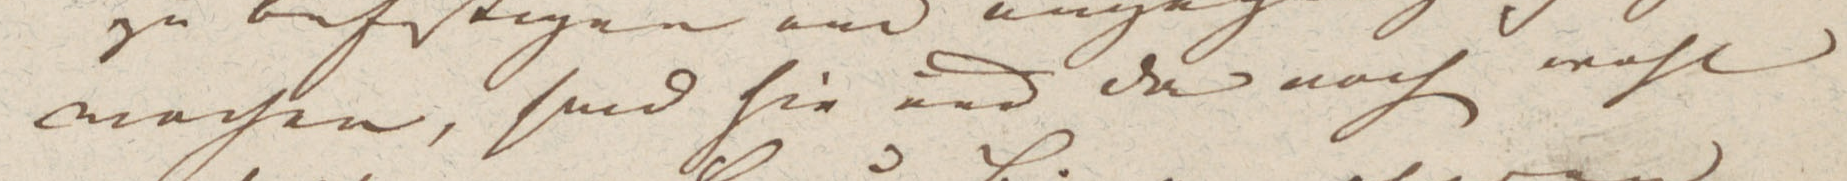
machen, sind hie und da noch wohl
